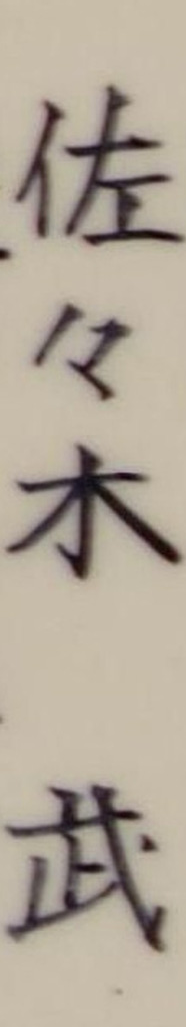佐々木武
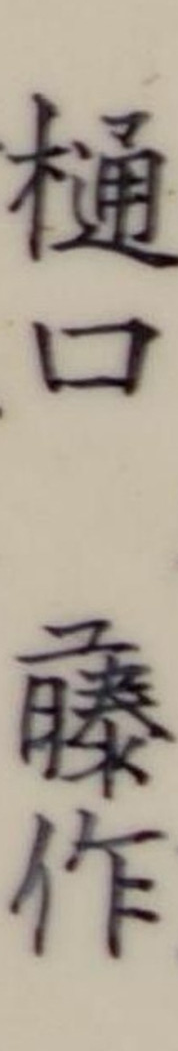樋口藤作
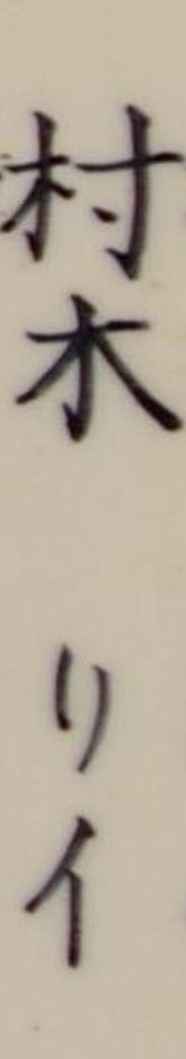村木リイ
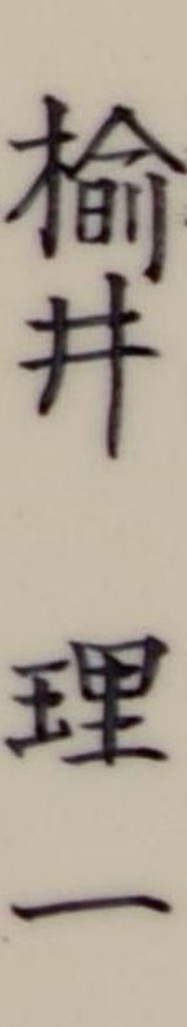楡井理一
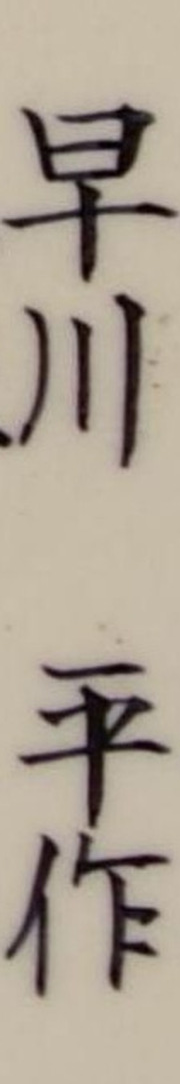早川平作
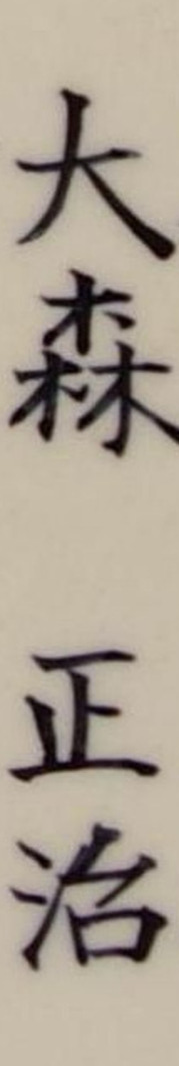大森正治
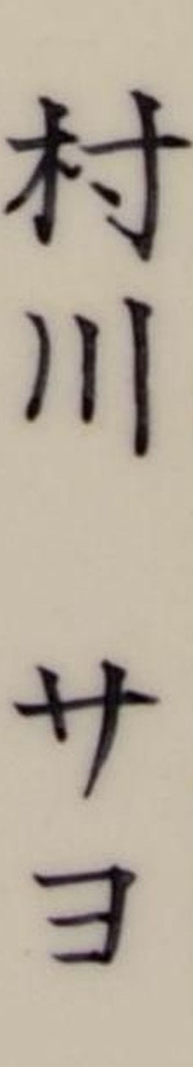村川サヨ
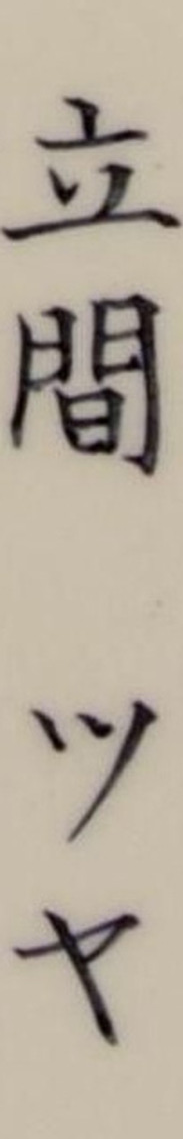立間ツヤ
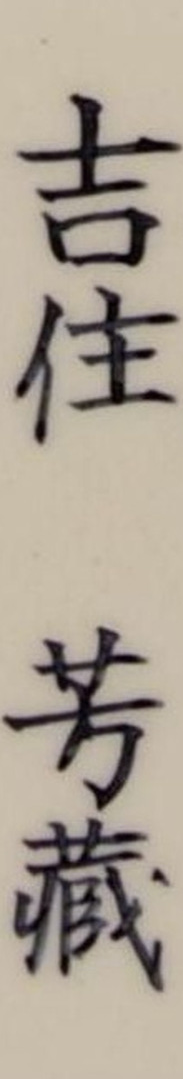古住芳蔵
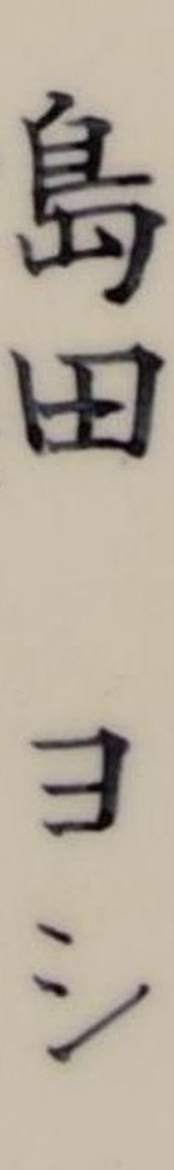島田ヨシ
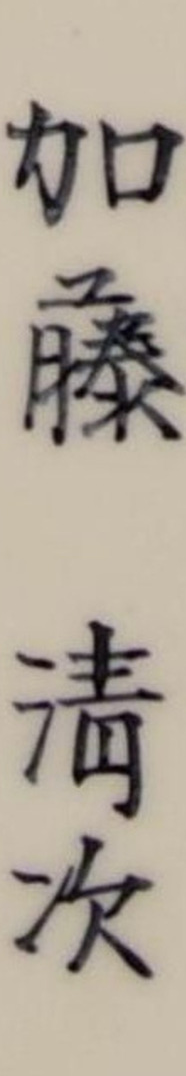加藤清次
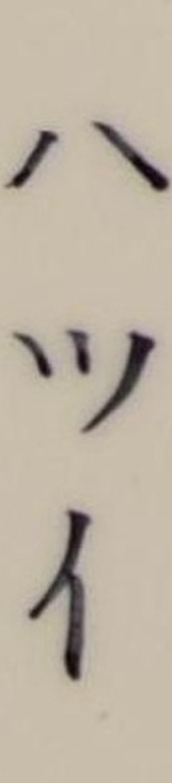ハツイ
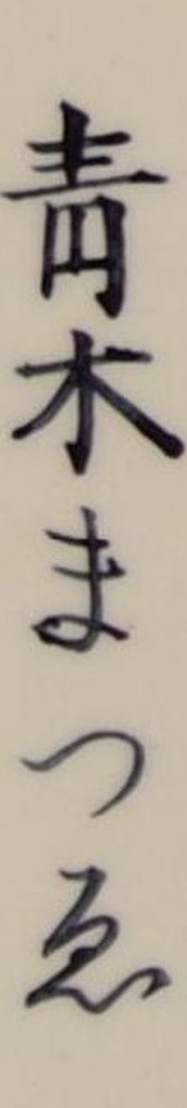青木まつゑ
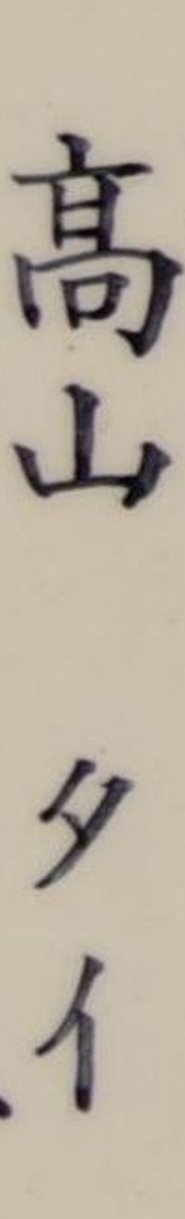高山タイ
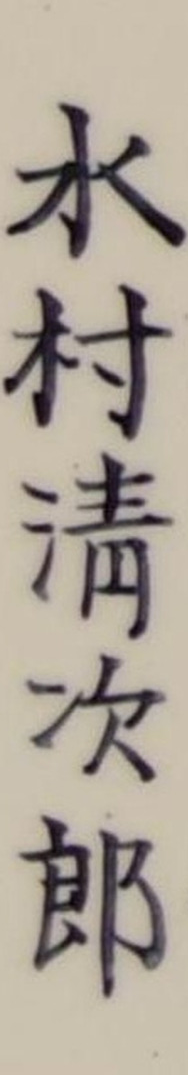水村清次郎

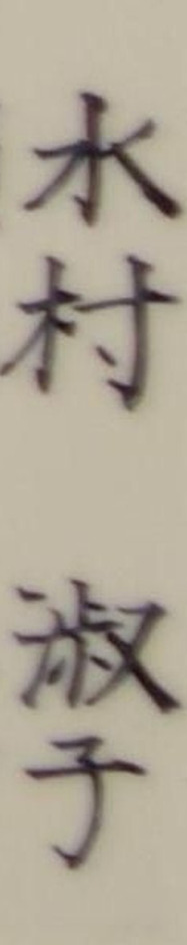水村淑子
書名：M~S
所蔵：高野山金剛峯寺
